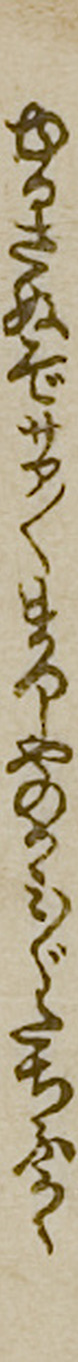ゆるさぬぞサア〳〵まつしやのかミ〴〵たちふかく
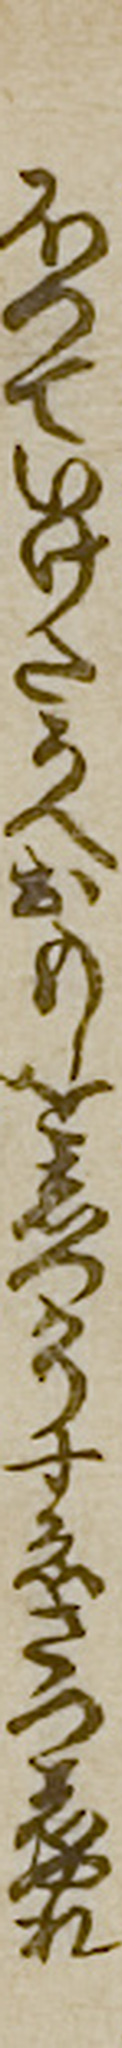ほつていけたうへおもしをしつかりすゑさつしやれ
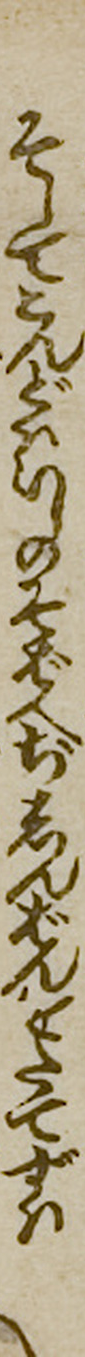そしてこんどハいしのそばへぢしんばんをたてずハ
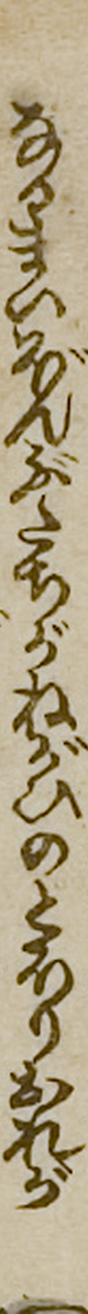なるまいぼんぶたちがねがひのとほりおれが
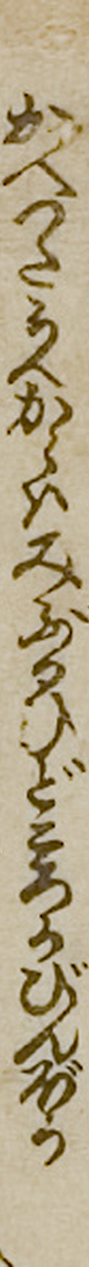かへつたうへからハみぶるひどころかびんぼう
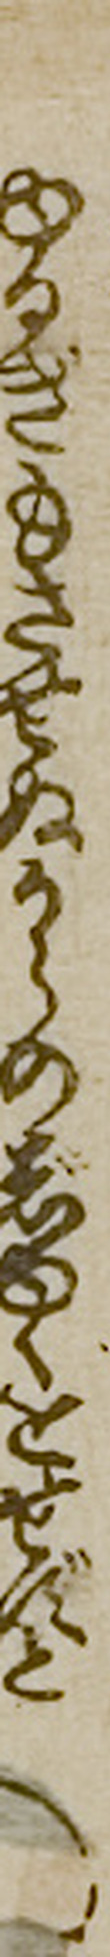ゆるぎもさせぬからのじゆくをせずと
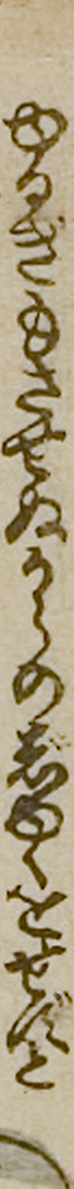ゆるぎもさせぬからのじゆくをせずと
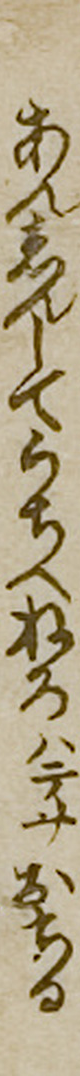あんしんしてうちへねろハテサおちる
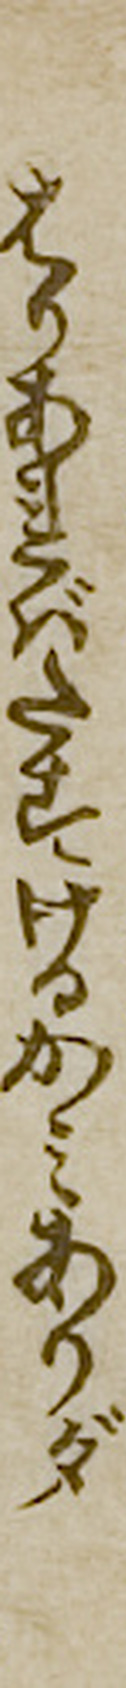はりあれバたすけるかミありダ
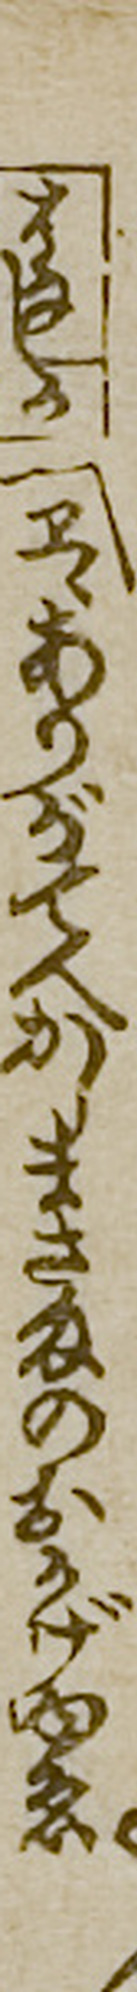はなしか「エヽありがてへかしまさまのおかげゆゑ
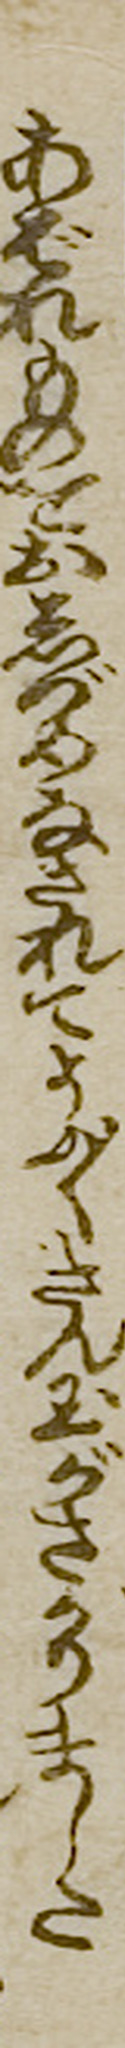あばれものをおしずめなされてよふ〳〵きん玉がさがりました
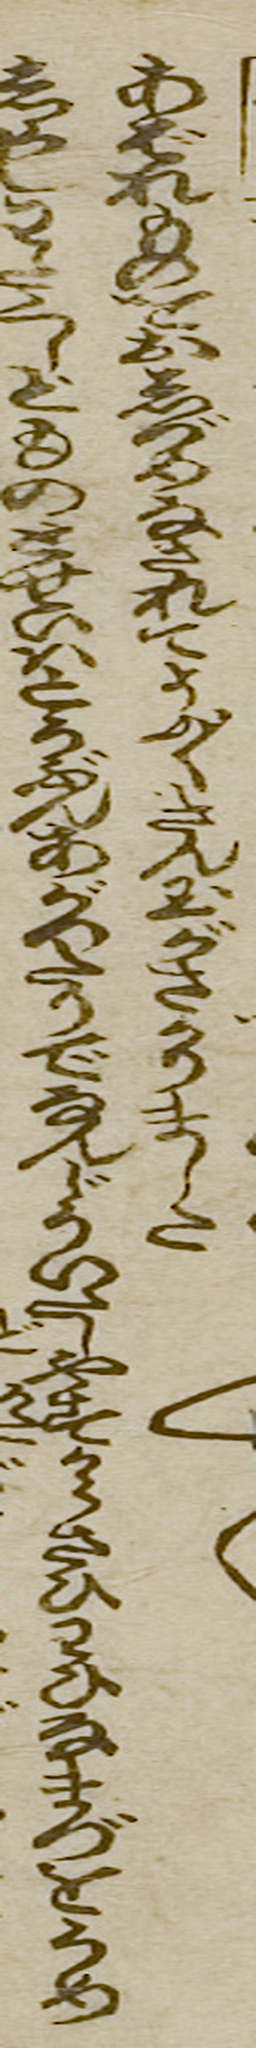しかしわたくしどものとせいハとうぶんあがつたりでなんじういたしやすからさひわひなまづをうめ
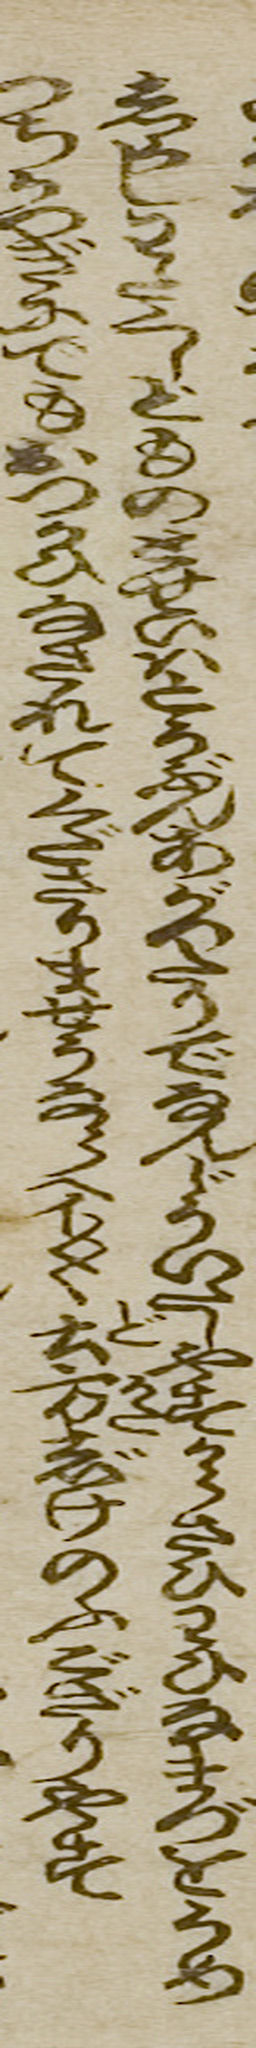つちかやぎにでもおつかひなされてくださりませうならヘイ〳〵〳〵土方じけのふござりやす
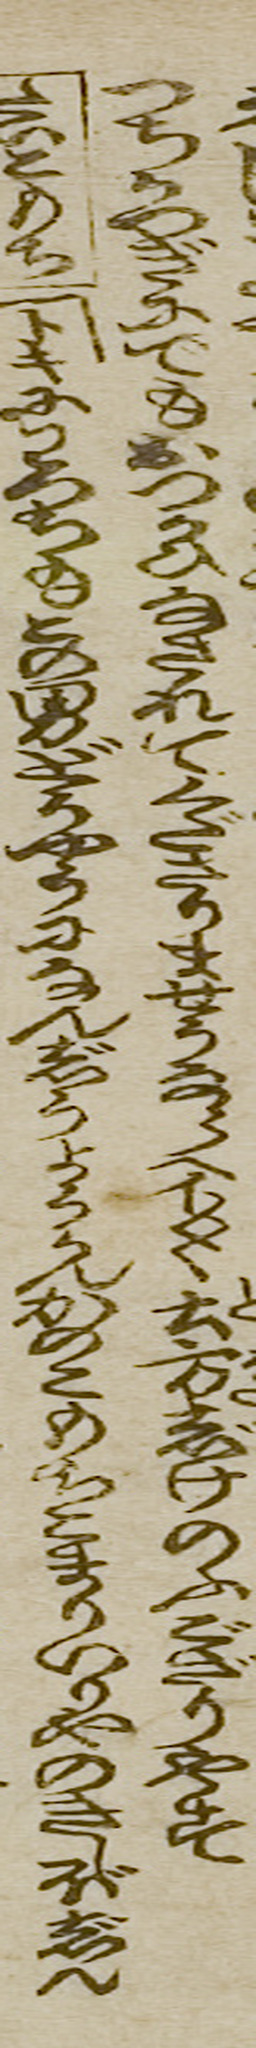たいこもち「トキにわつちもこの男どうやうになんじうようかんかのこもちこまりいりやのきしぼじん
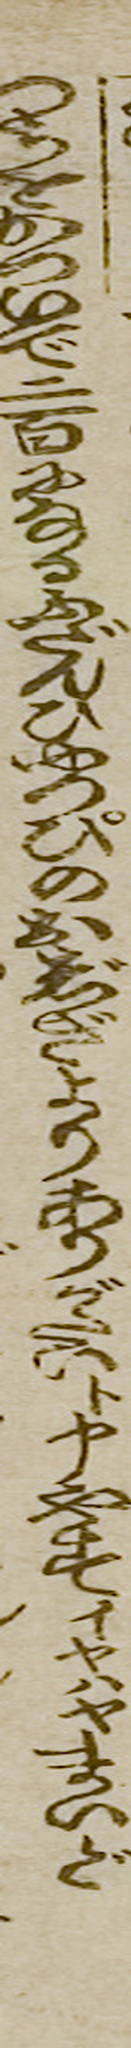つちをかついで二百になるふだんひやつぴのおじぎよりありがたいト申やすイヤハヤまいど
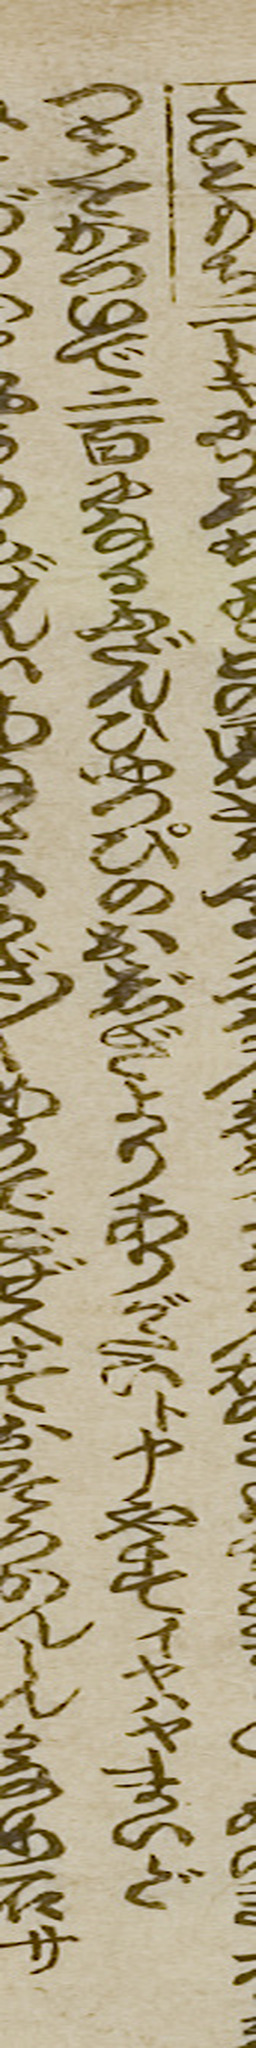なまづのおりやかりかげんハあなたにかぎ〳〵めうでごぜへすおそろかんしんかなめ石サ
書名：おそろ感心要石
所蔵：東京大学総合図書館 General Library in the University of Tokyo, JAPAN
